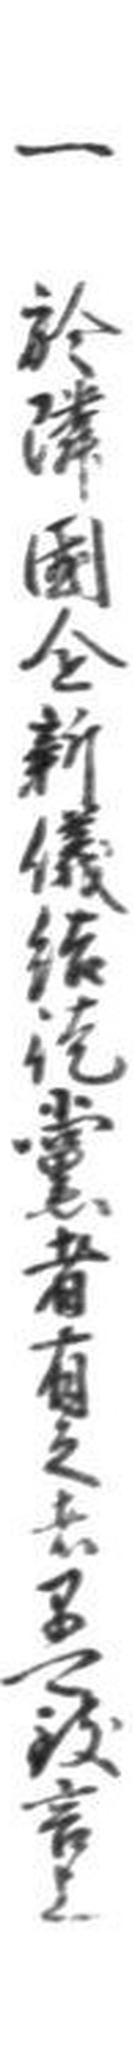一於隣国企新儀結徒党者有之者早可致言上

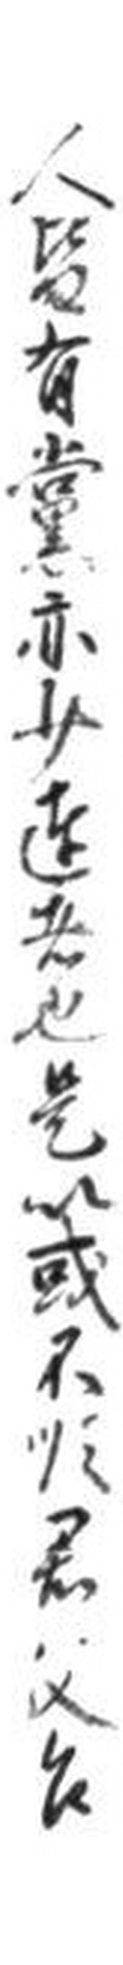人皆有党亦達者也是以或不順君父台
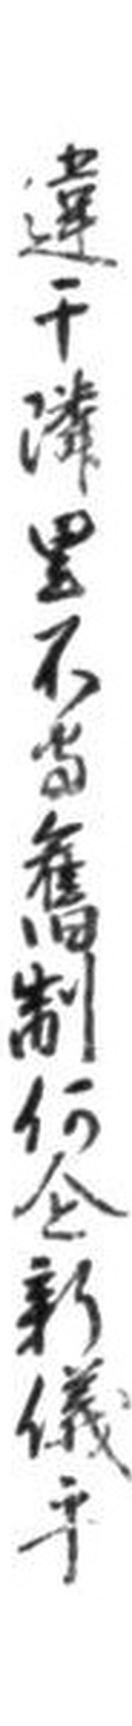違于隣里不守旧制何企新儀乎
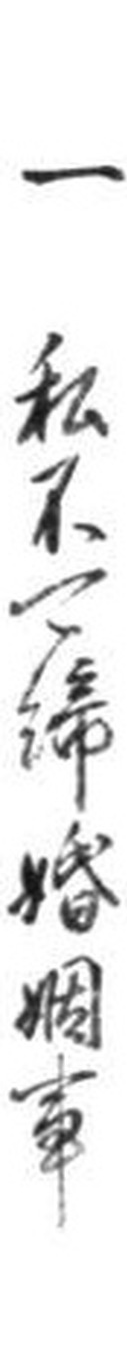一私不可締婚姻事
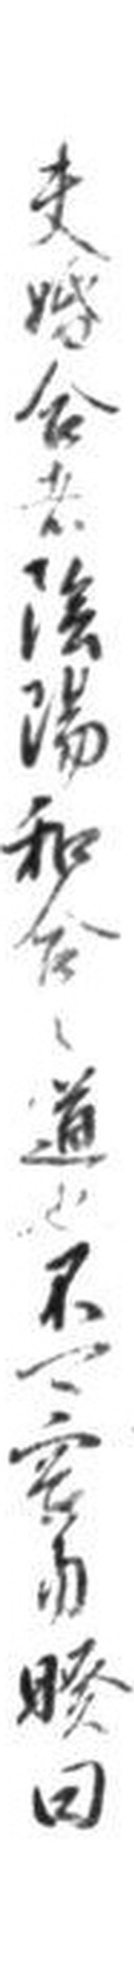夫婚合者陰陽和合之道也不可容易睽曰
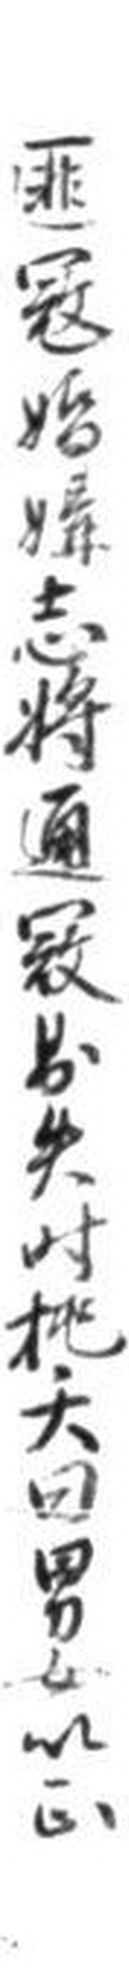匪寇婚媾志将通寇則失時桃夭曰男女以正
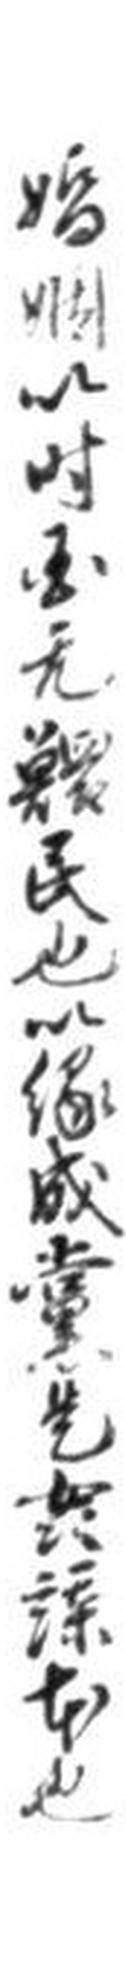婚姻以時国无鰥民也以縁成党是姦謀本也
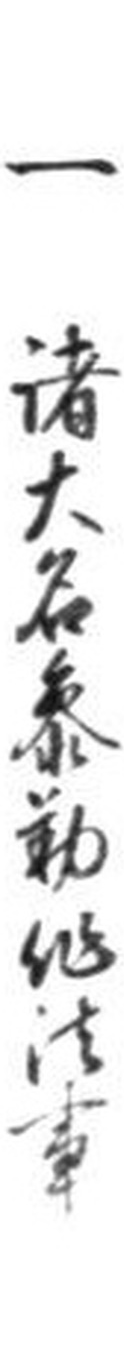一諸大名参勤作法事
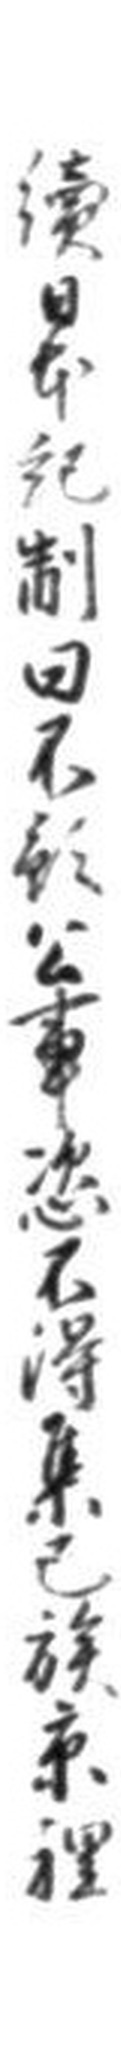続日本記制曰不預公事恣不得集己族京裡
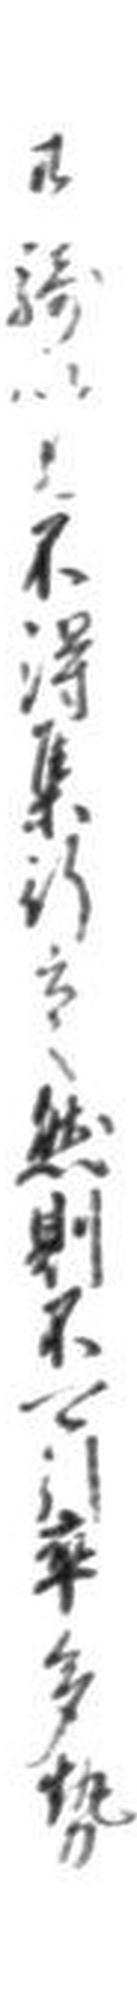廿騎以上不得集行云々然則不可引率多勢
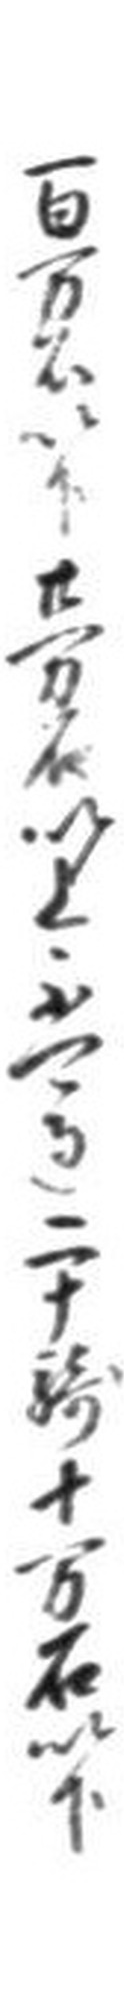百万石以下廿万石以上不可過二十騎十万石以下
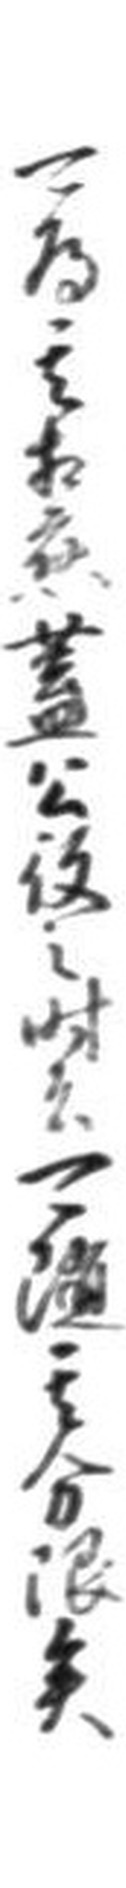可為其相応蓋公役之時者可随其分限矣
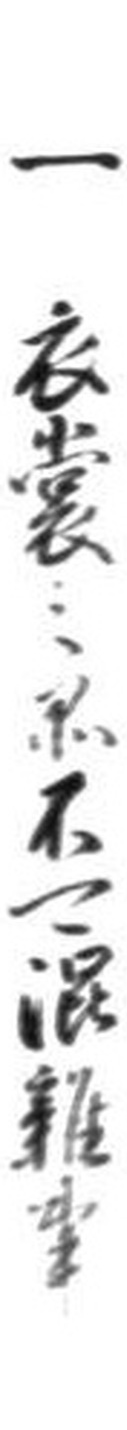一衣装之品不可混雑事
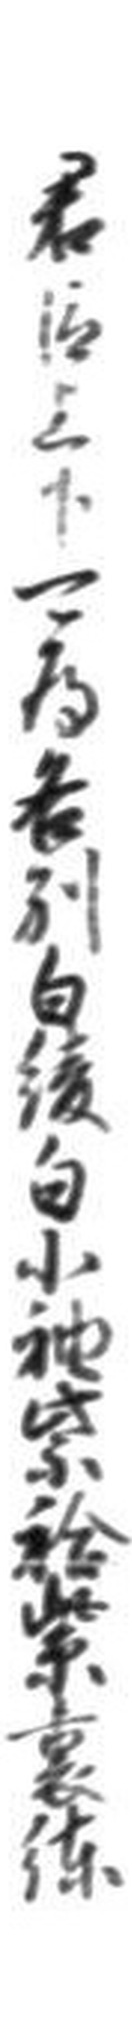君臣上下可為各別白綾白小袖紫袷紫裏練
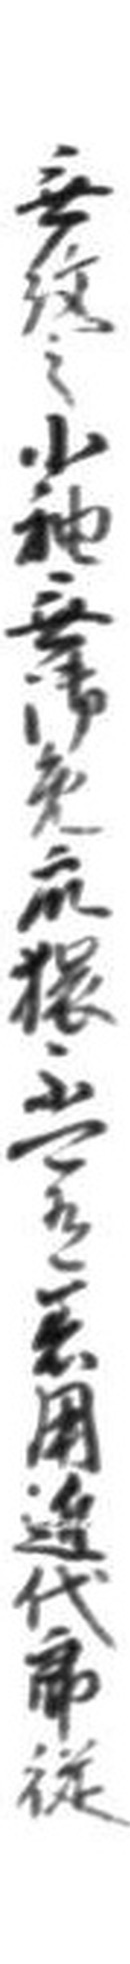無紋之小袖無御免衆猥不可有着用近代郎従
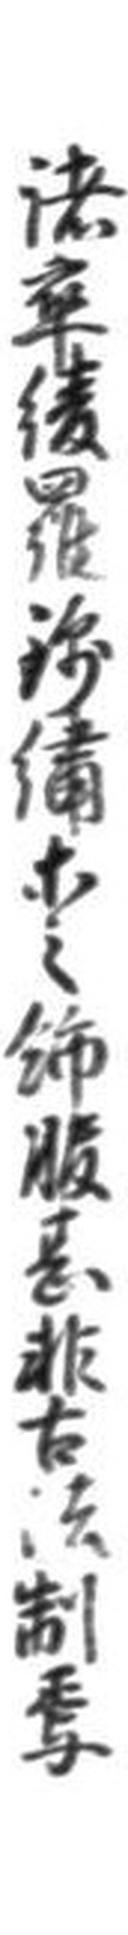諸卒綾羅錦繍等之飾服甚非古法制焉
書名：家譜 二 忠直公 従文禄四年到慶安四年
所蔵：福井県文書館 Fukui Prefectural Archives
